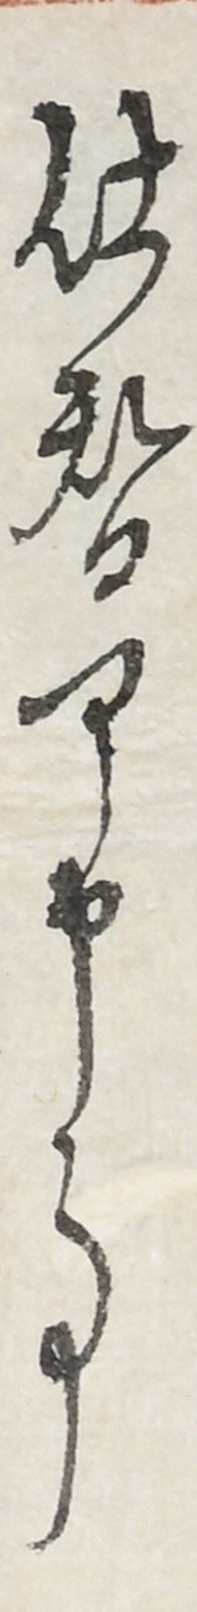仕替可申事
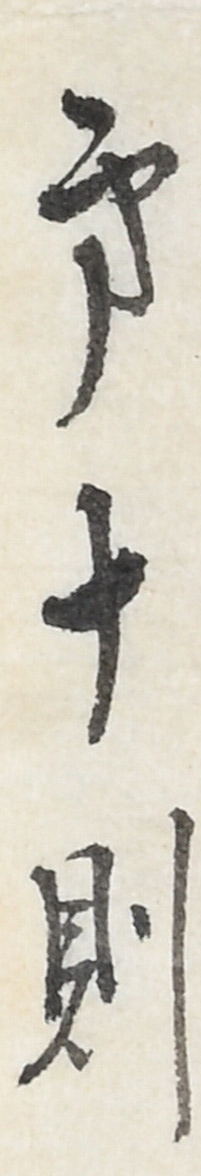第十則

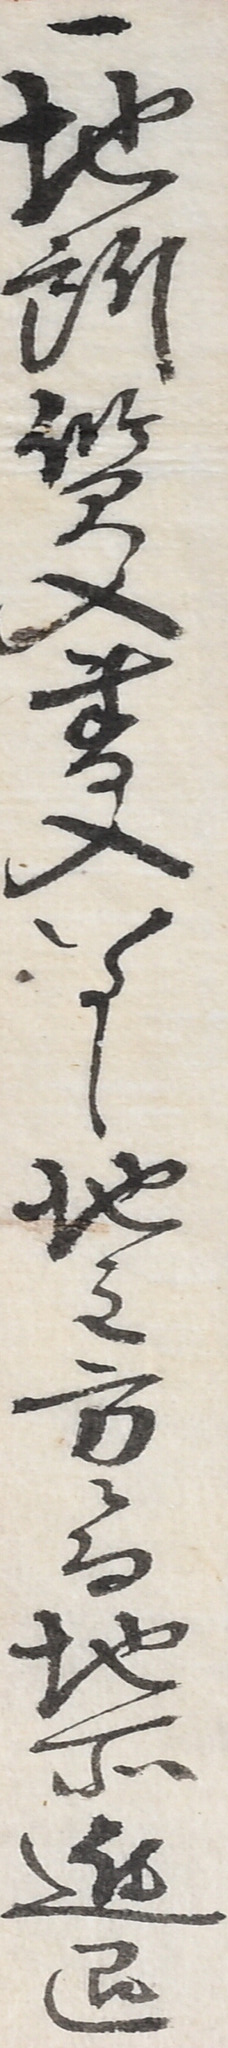一地所質入書入いたし地主方にて地所進退
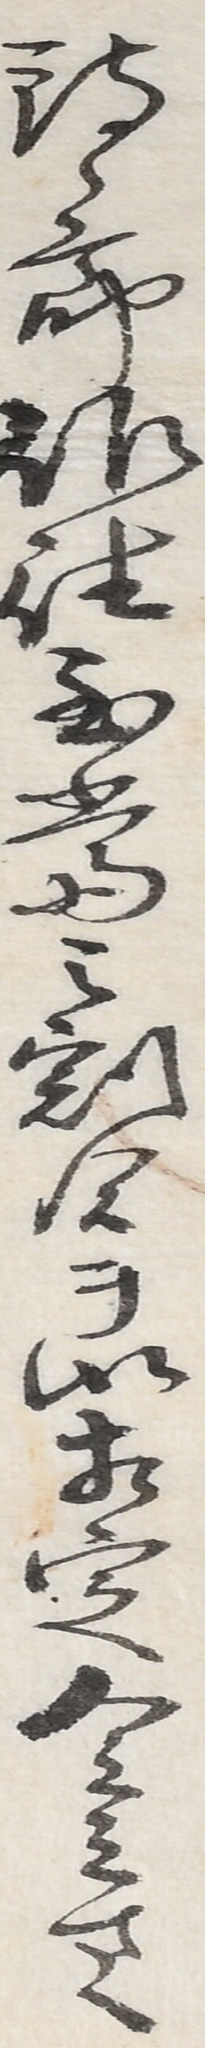致候節往至当之割合を以相定金主方へ
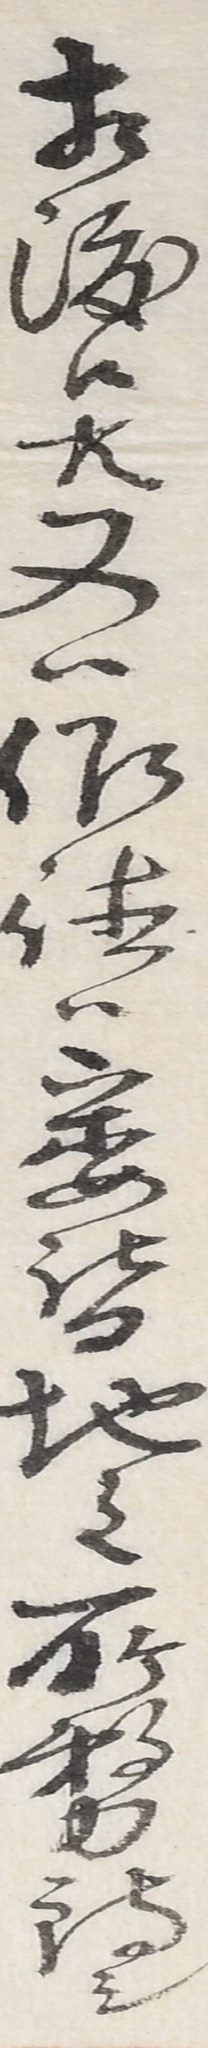相渡候共又は作徳は悉皆地之所務致シ
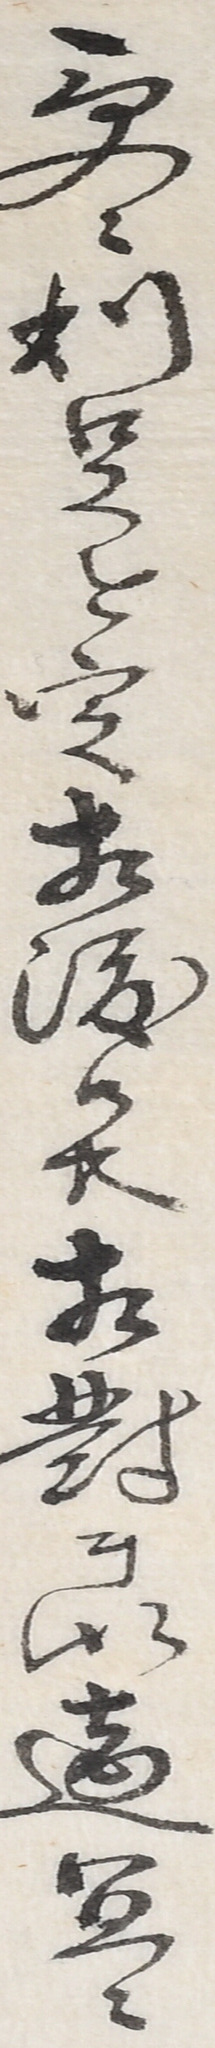更に利足を定相渡候共相対を以適宜に
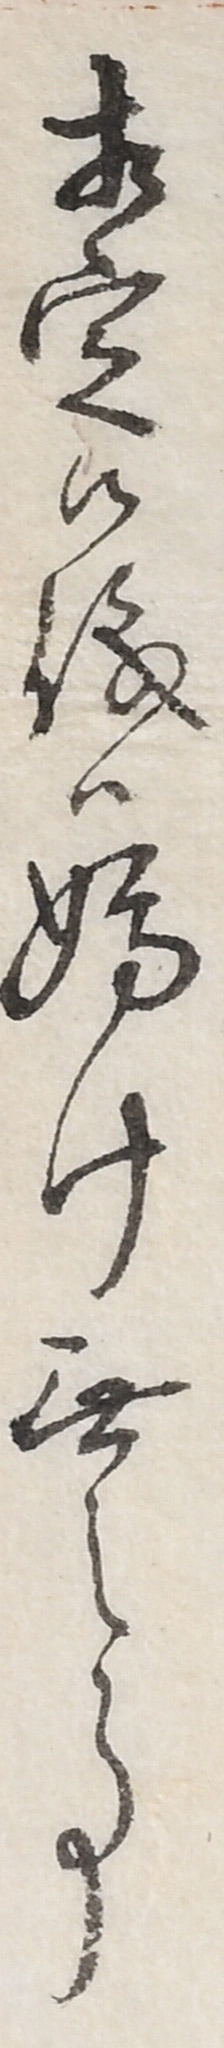相定候儀は妨け無之事
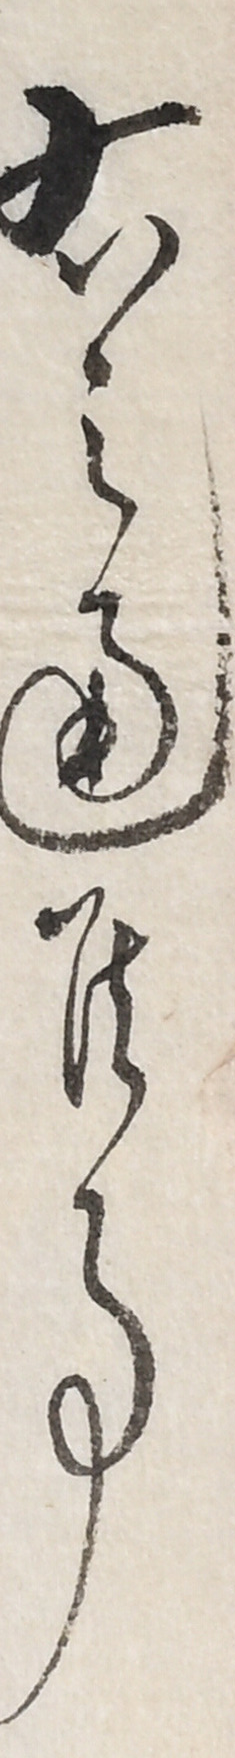右之通候事
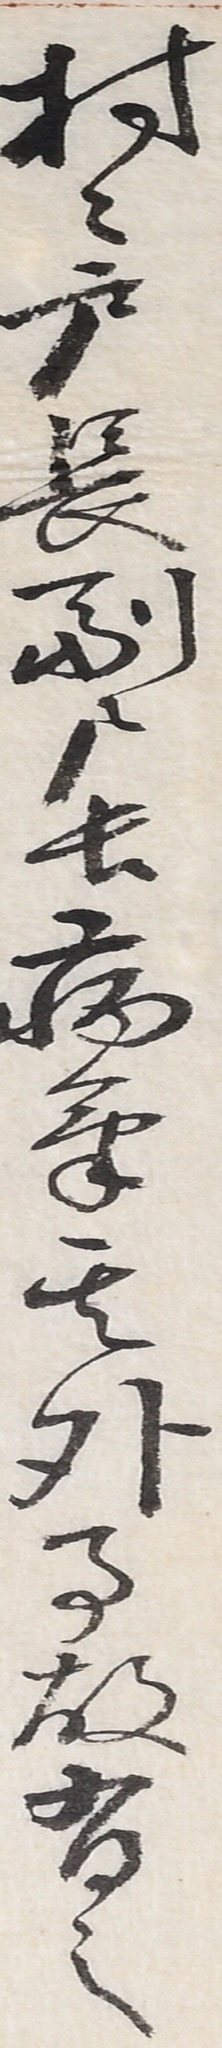村々戸長副戸長病気其外事故有之
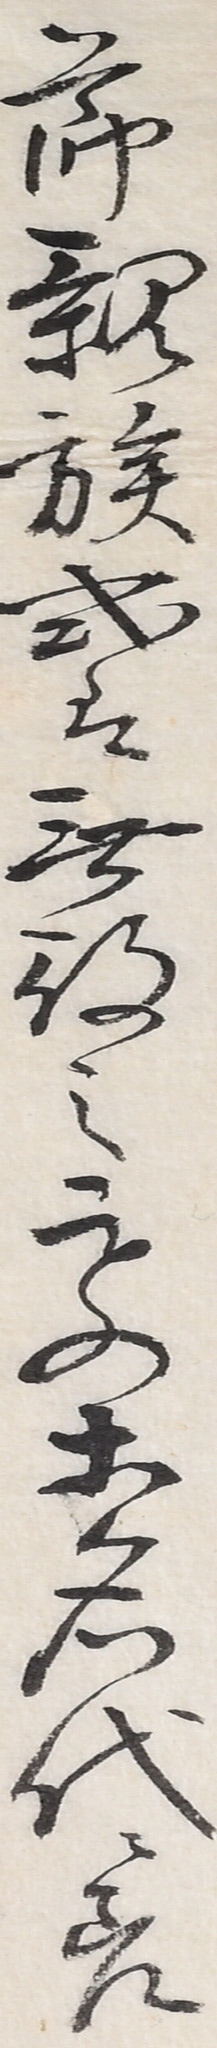節親族或は無役之もの等名代に差
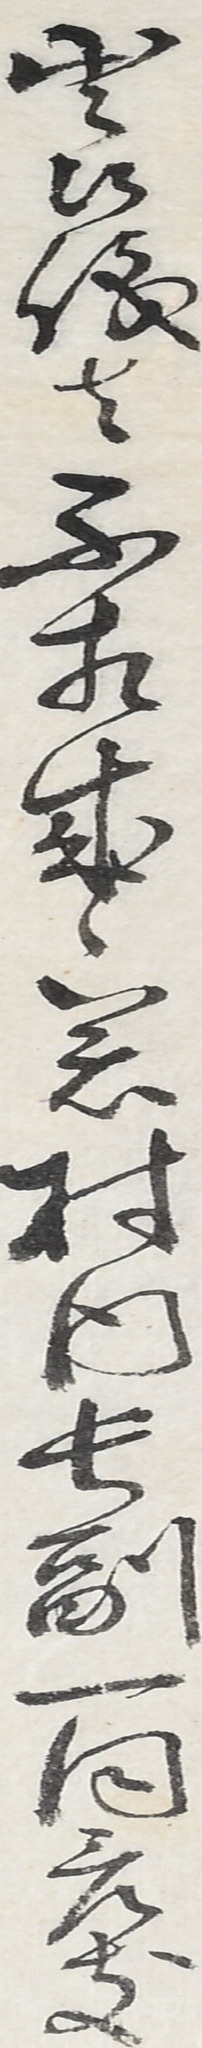出候儀は不相成候若村内長副一同差支
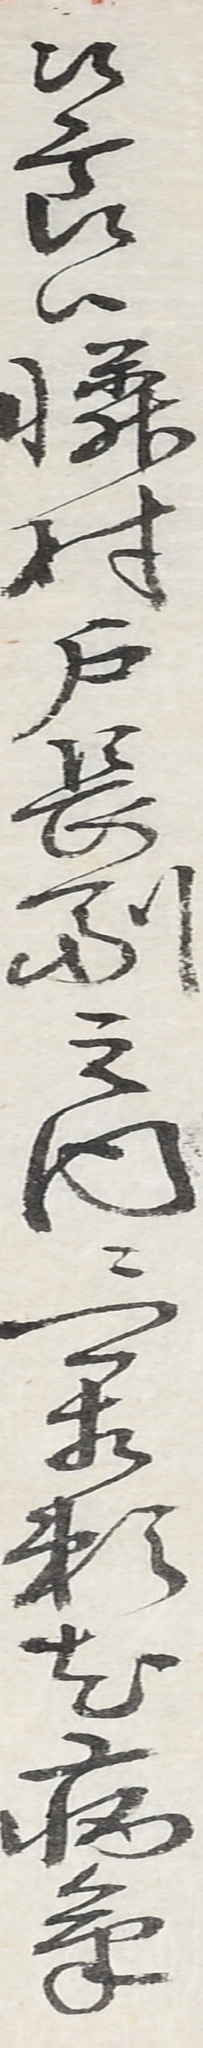候節候隣村戸長副之内に可相頼尤病気
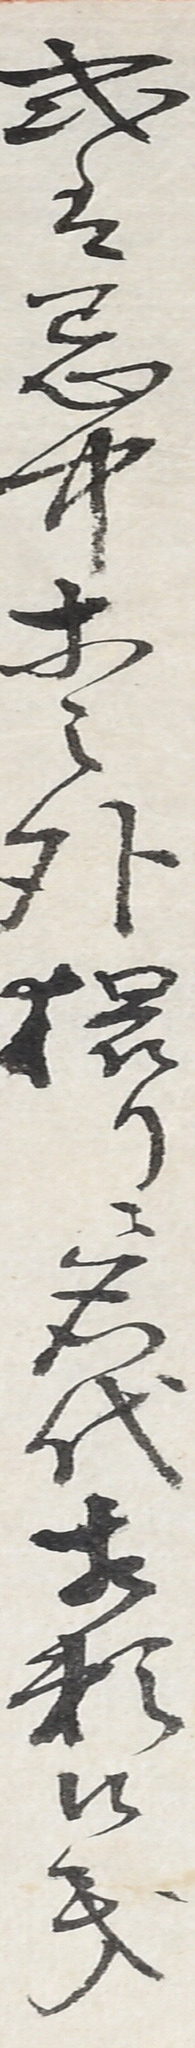或は忌中等之外猥りに名代相頼候義
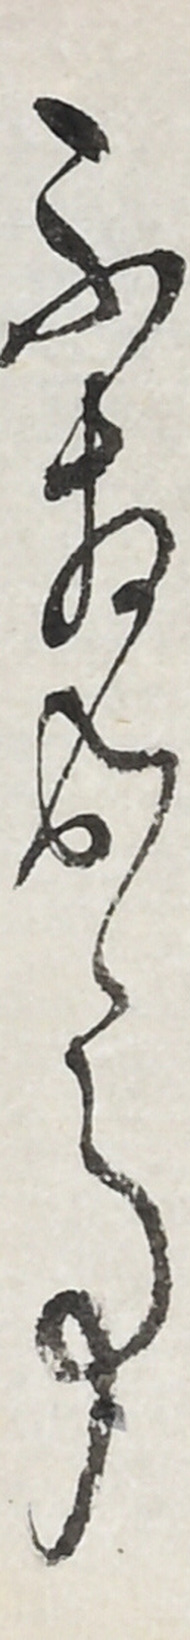不相成候事
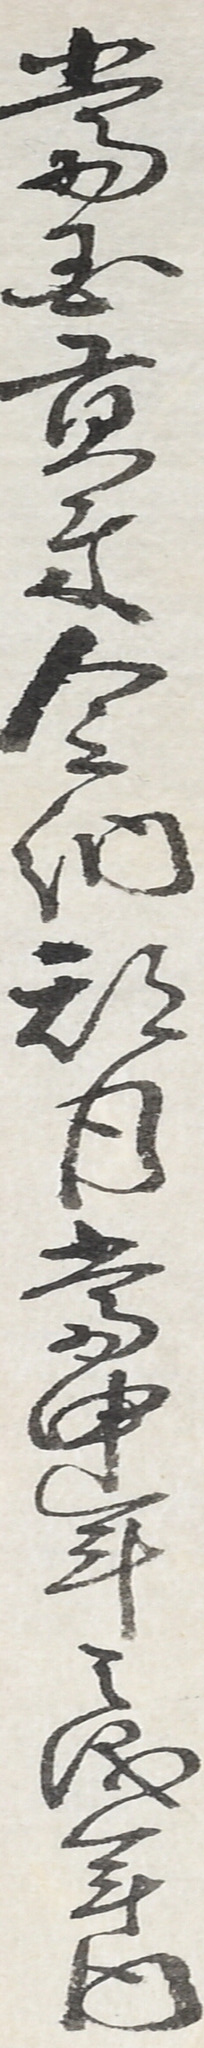当国貢米金納期月当申年之儀年内
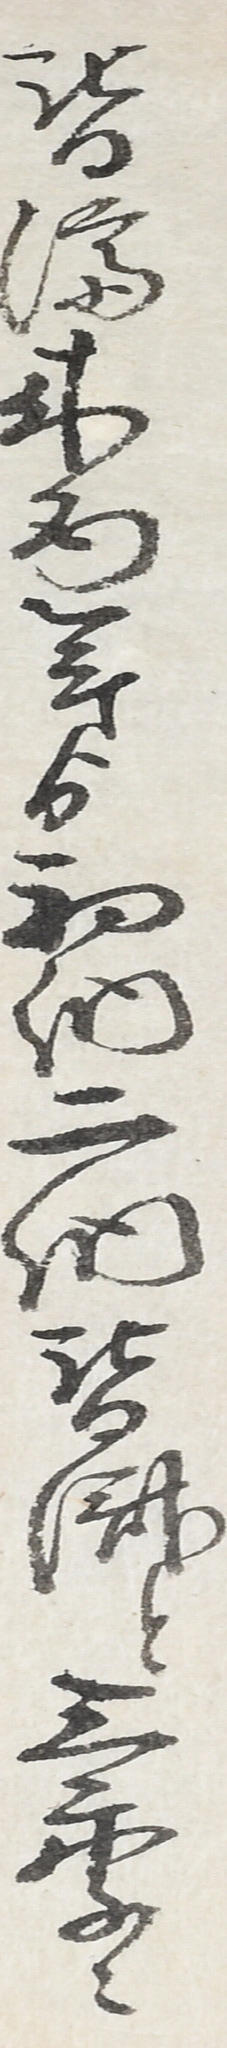皆済来酉年より初納二納皆済と三季に
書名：壹番・御布告一式
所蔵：伊那市立高遠町図書館・合同会社AMANE
